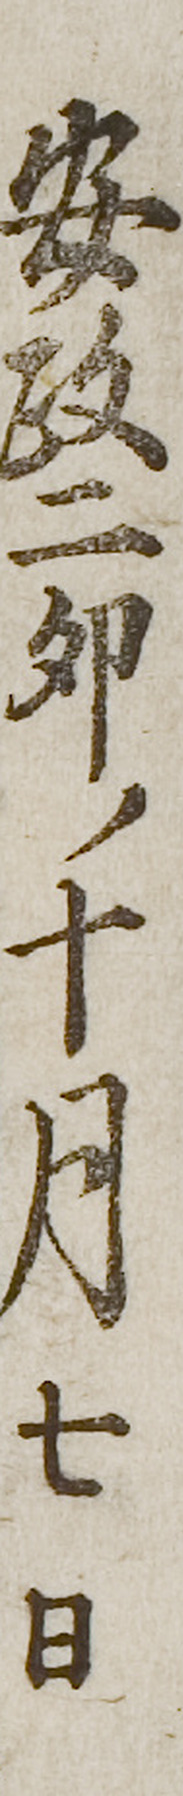安政二夘ノ十月七日
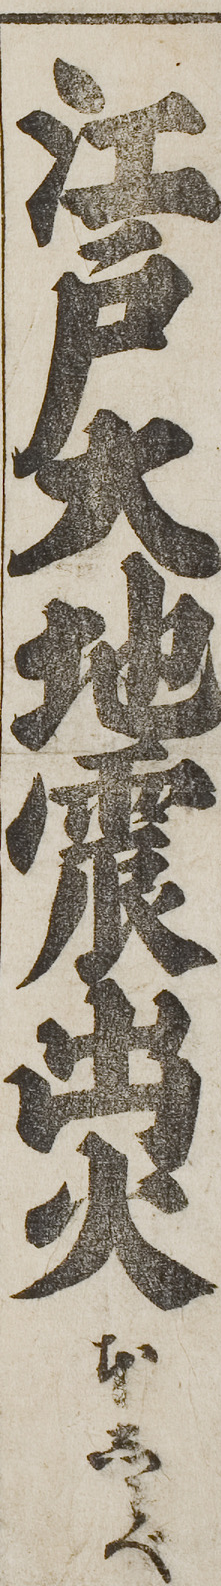江戸大地震出火本しらべ
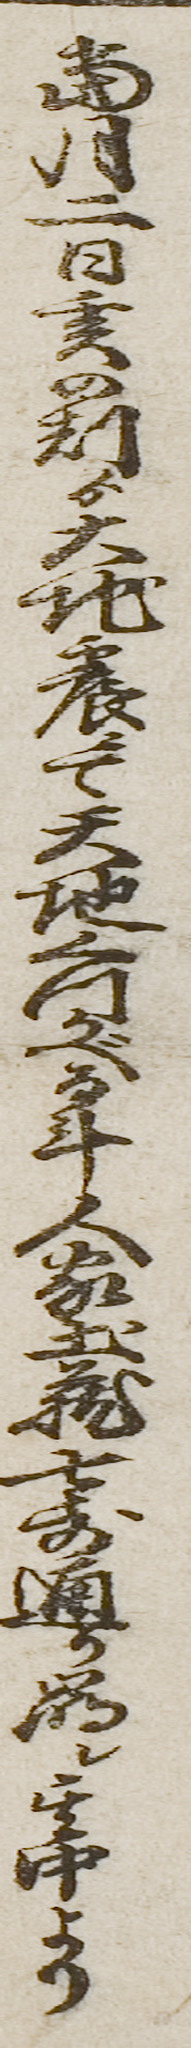当月二日亥の刻ゟ大地震にて天地くつがへる斗人家土蔵七歩通り崩れ其中より
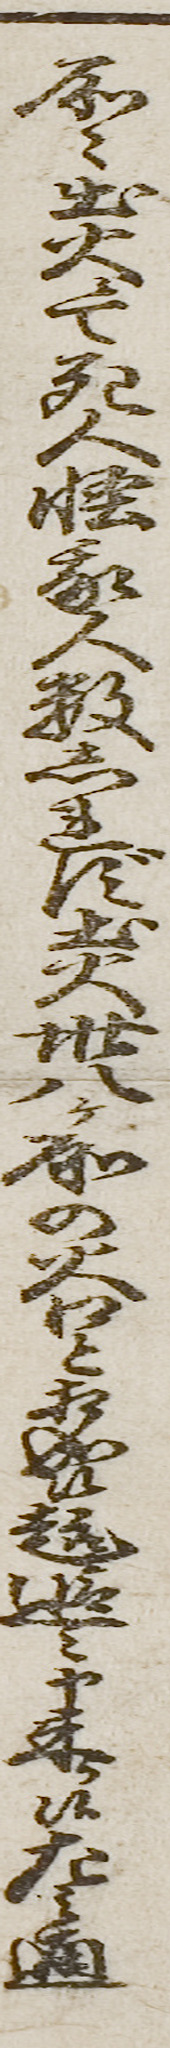所々出火にて死人怪我人数しれず出火卅八ヶ所の火口と相成候趣追々申来り候左之通
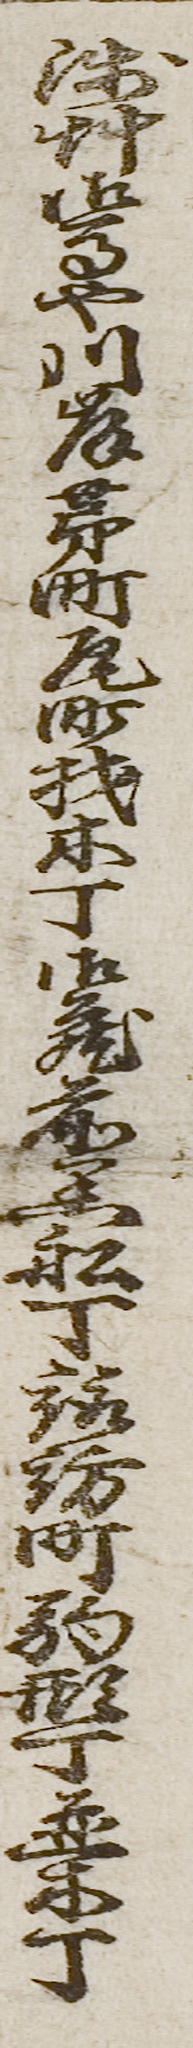浅草御馬や川岸茅町瓦町材木丁御蔵前黒船丁諏訪町駒形丁並木丁
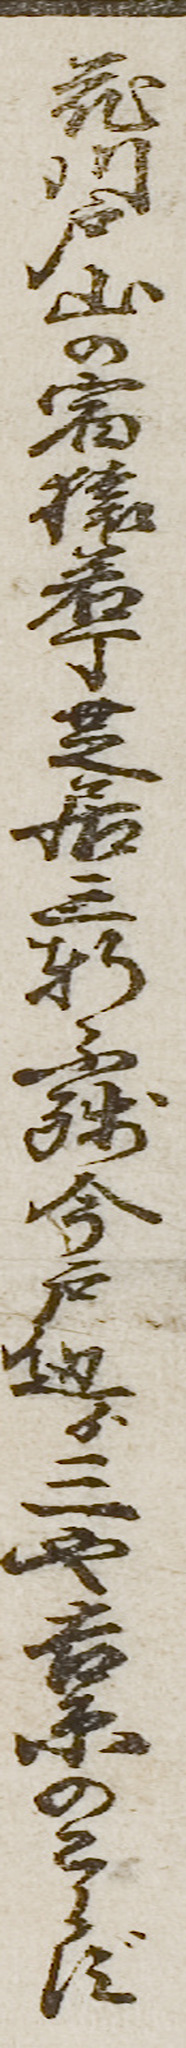花川戸山の宿猿若丁芝居三軒不残今戸辺ゟ三や吉原のこらず
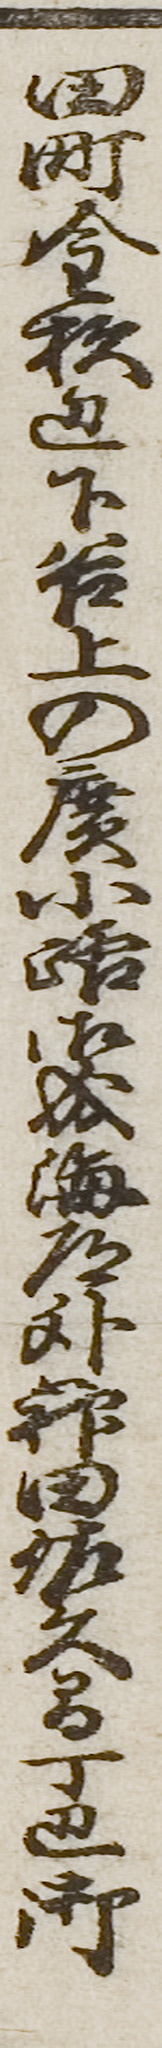田町金杉辺下谷上の広小路御成海道外神田佐久間丁辺御
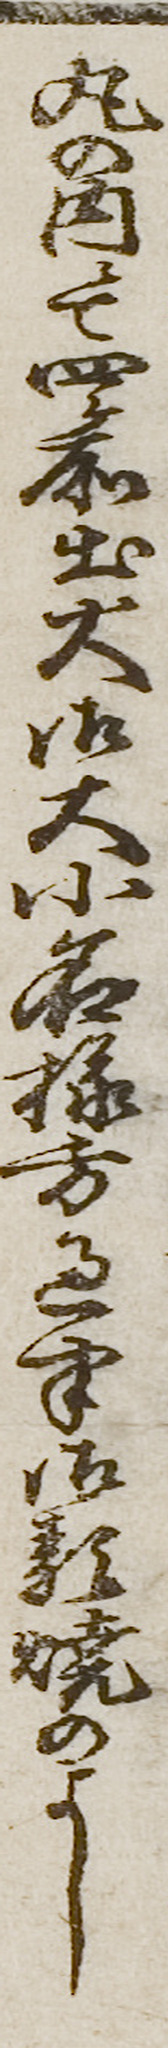丸の内にて四ケ所出火御大小名様方過半御類焼のよし
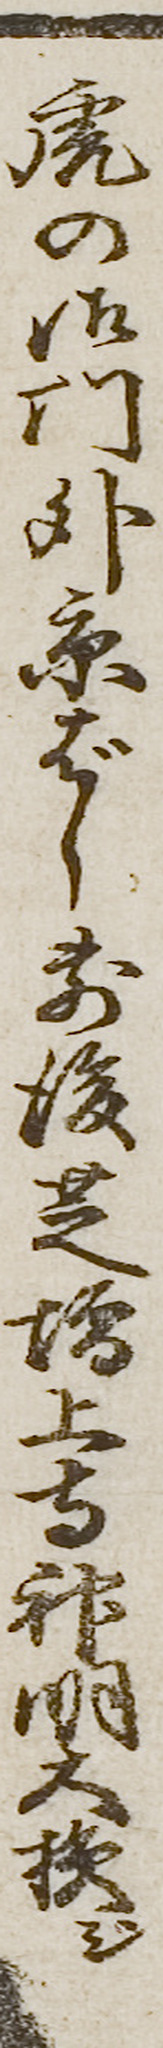虎の御門外京ばし前後芝増上寺神明大損ジ
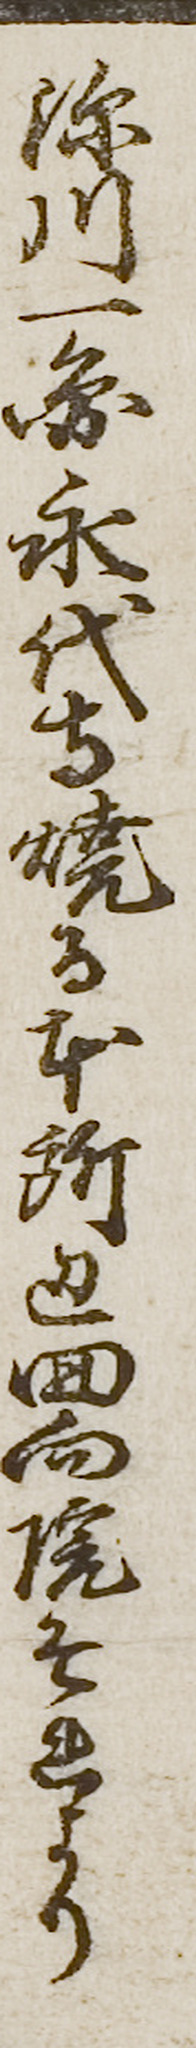深川一円永代寺焼る本所辺回向院それより
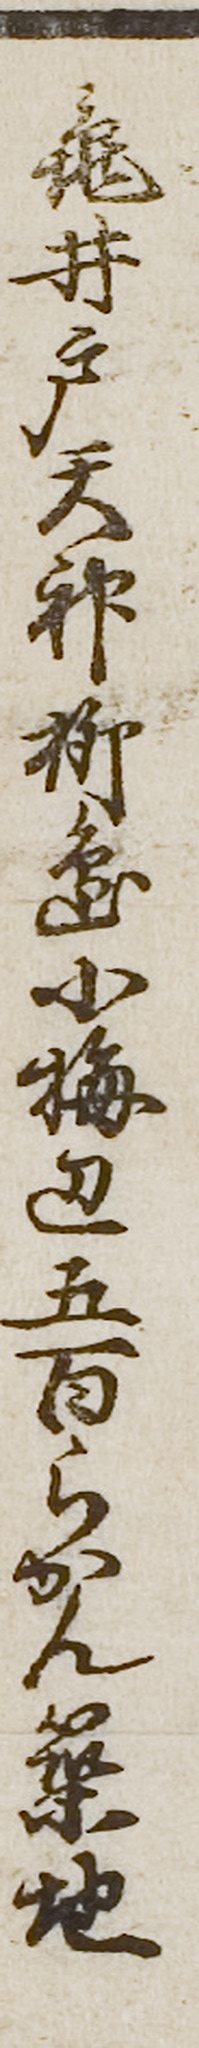亀井戸天神柳島小梅辺五百らかん築地
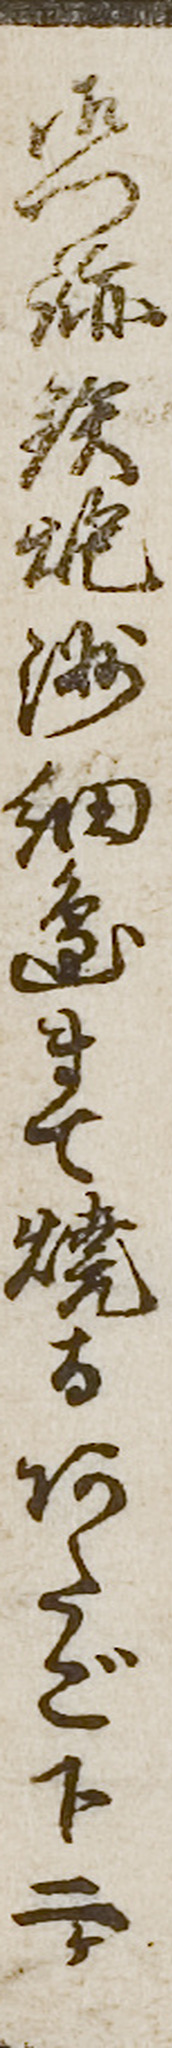御門跡鉄砲洲細辺まて焼るあたご下二ケ
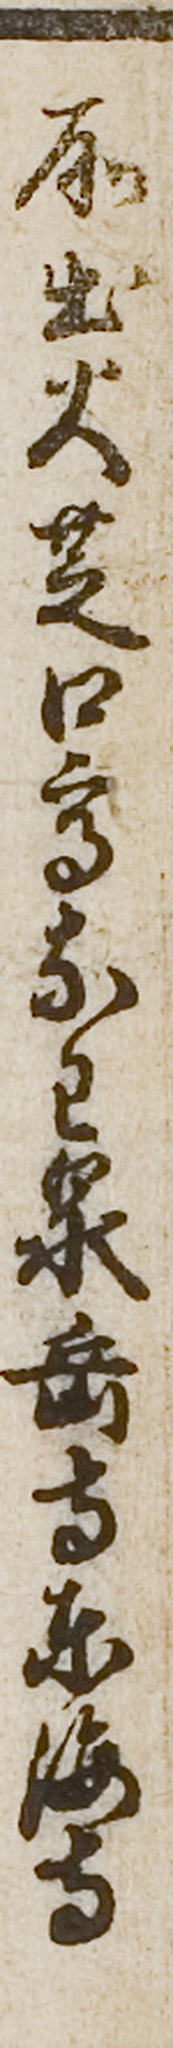所出火芝口高なわ泉岳寺東海寺
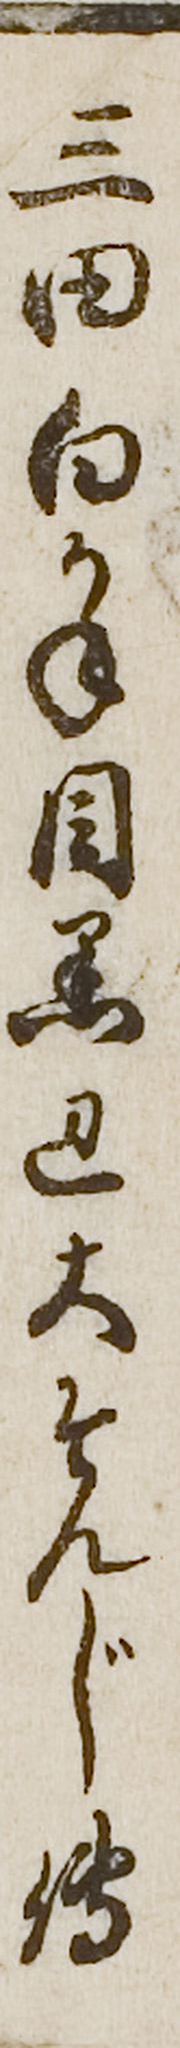三田白かね目黒辺大そんじ伝
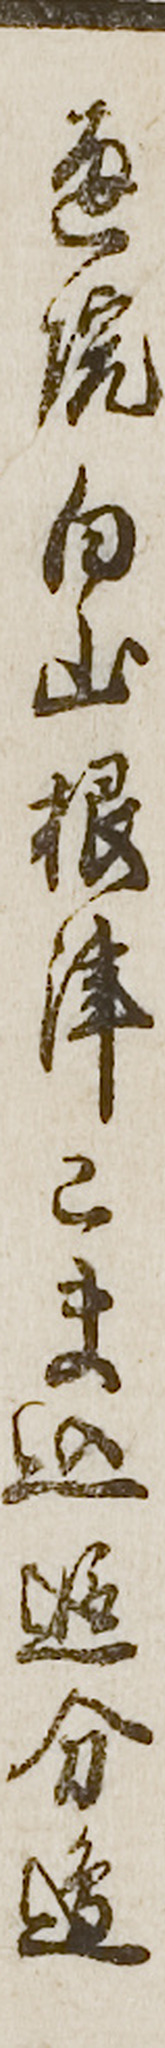通院白山根津こま込追分辺
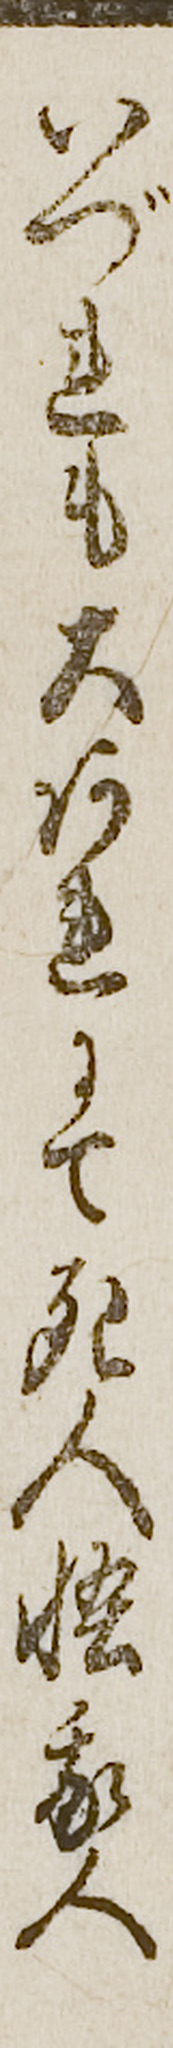いづれも大あれにて死人怪我人
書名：江戸大地震出火本しらべ
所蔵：東京大学総合図書館 General Library in the University of Tokyo, JAPAN
